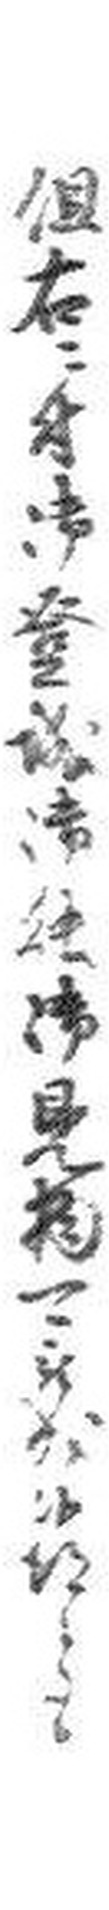但右ニ付御登城御能御見物可被成候得とも
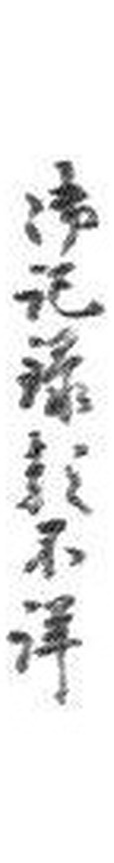御記録類不詳

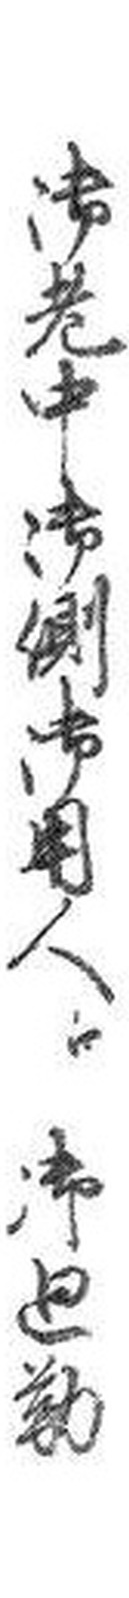御老中御側御用人江御廻勤
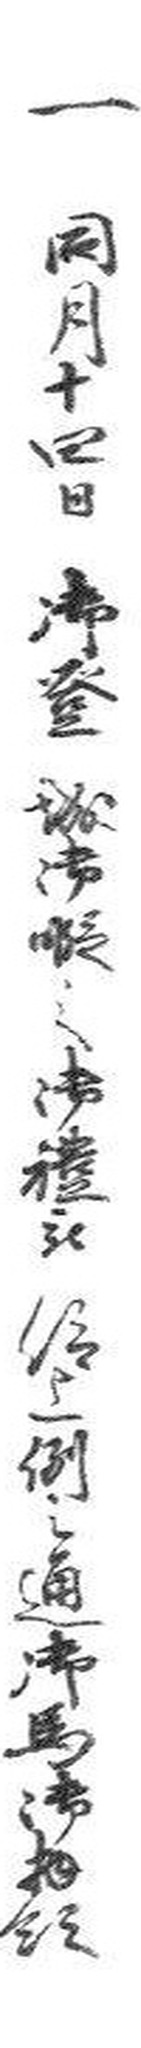一同月十四日御登城御暇之御礼被仰上例之通御馬御拝領
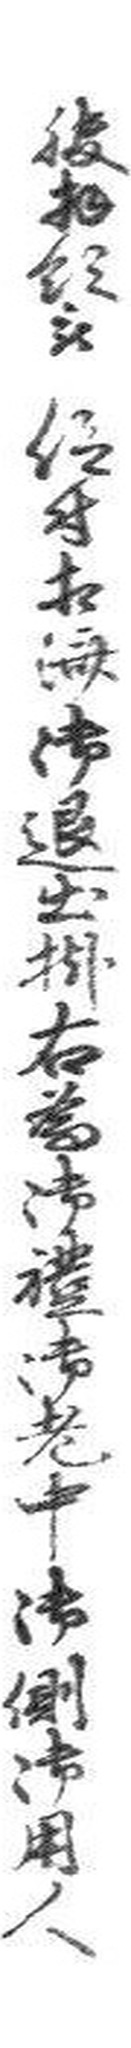服拝領被仰付相済御退出掛右為御礼御老中御側御用人
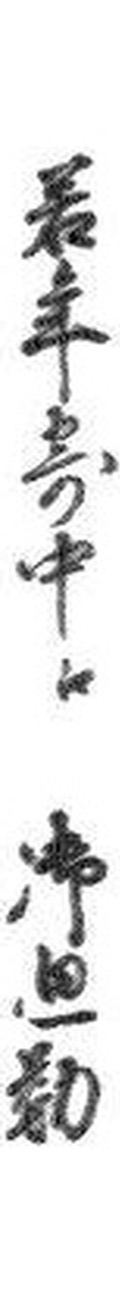若年寄中江御廻勤
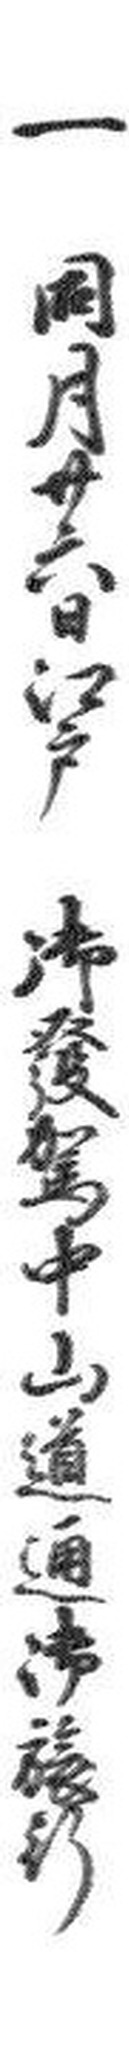一同月廿六日江戸御発駕中山道通御旅行
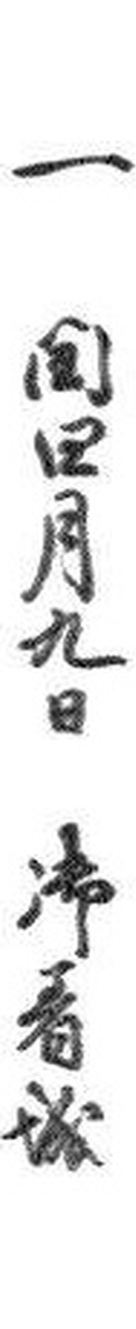一閏四月九日御着城
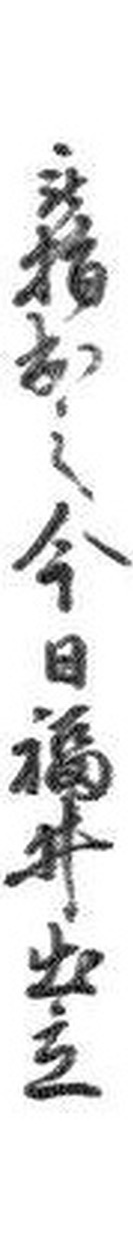被指出之今日福井出立
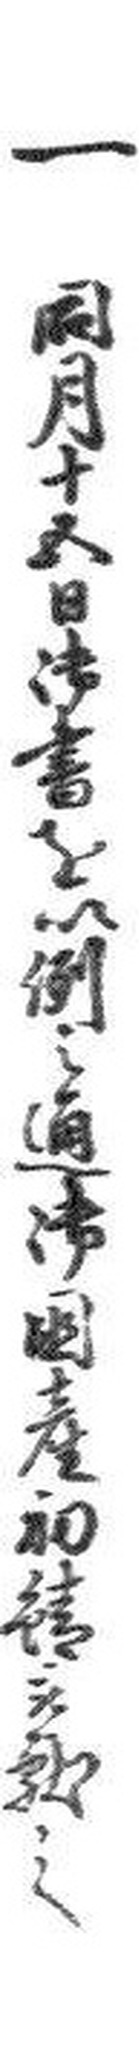一同月十五日御書を以例之通御国産初鯖被献之
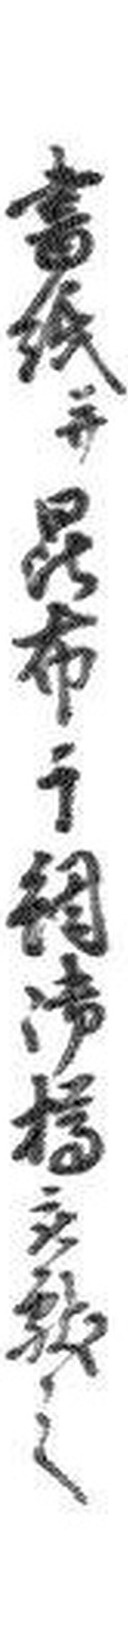書紙并昆布干鯛御樽被献之
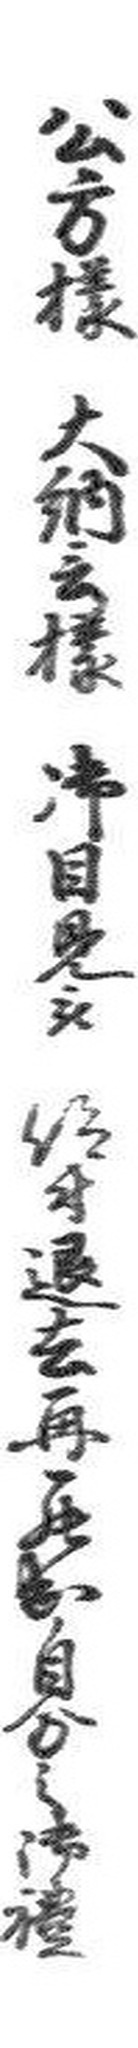公方様大納言様御目見被仰付退去再罷出自分之御礼
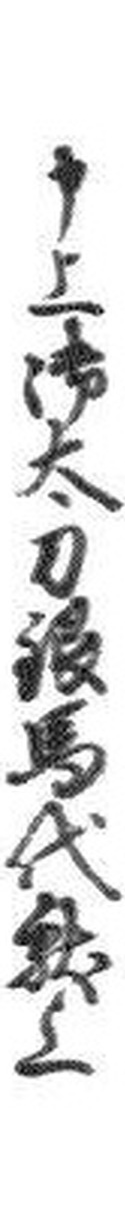申上御太刀銀馬代献上

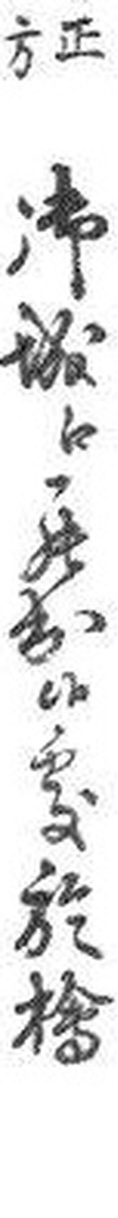方御城江罷出候処於檜
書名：家譜 二十三 吉品公 従宝永元年到同二年
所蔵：福井県文書館 Fukui Prefectural Archives
